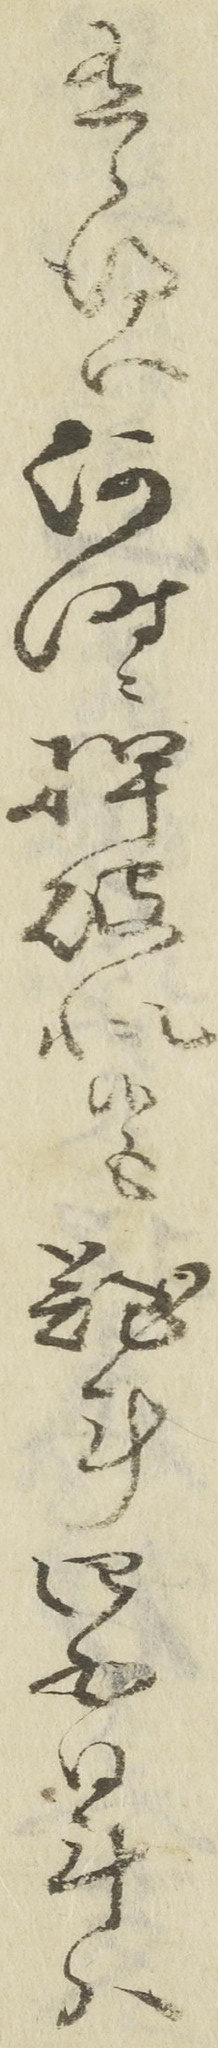有候得ハ何時ニ押出破れ候も難斗四五日斗ハ
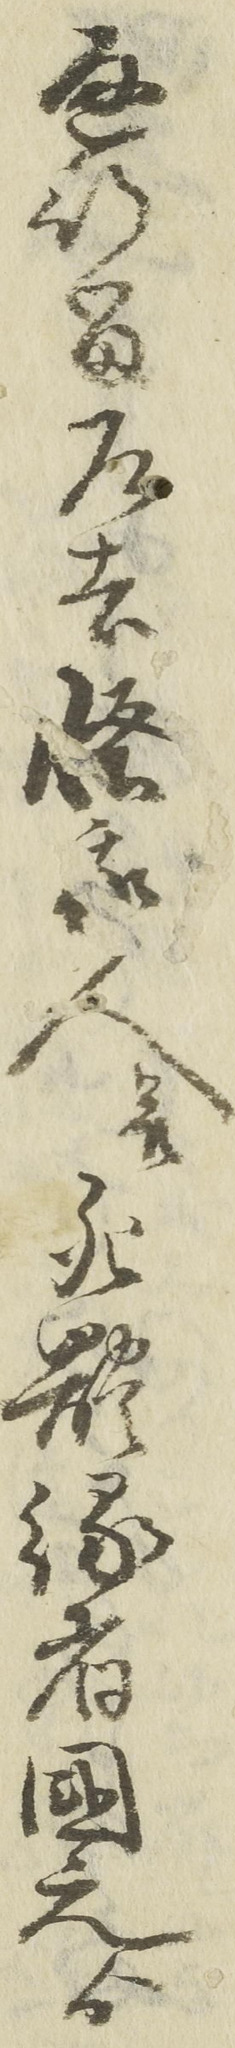通行留乍去怪我人幷死体縁者国元ゟ
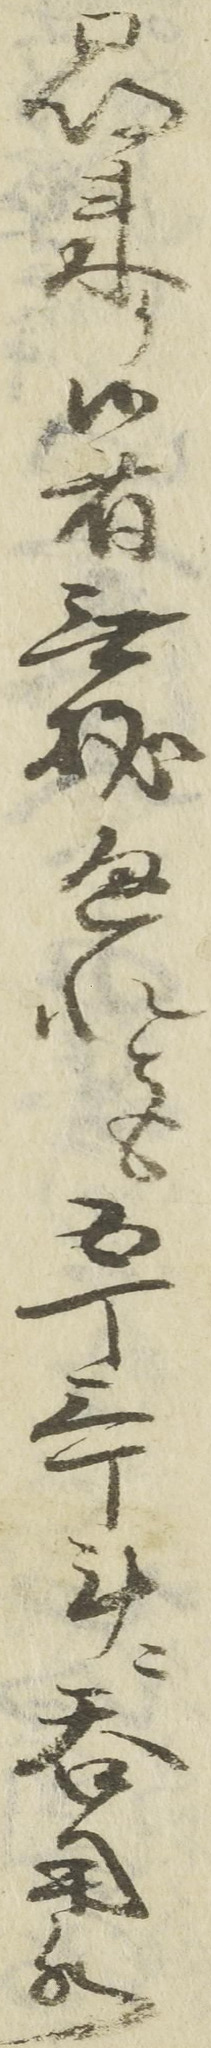尋来り候有無拠通れとも五丁三丁斗ニ呑用水
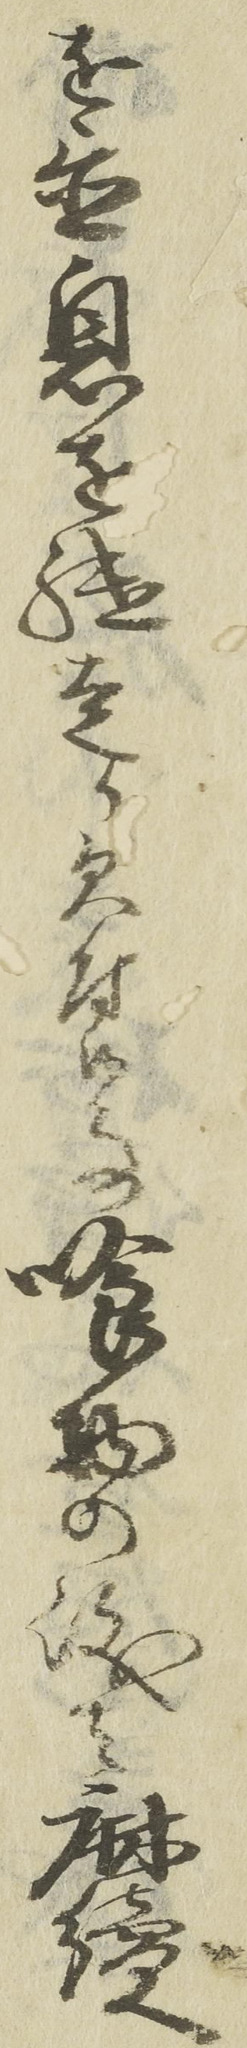を置息を継走り見付候事喰物の儀は麻続
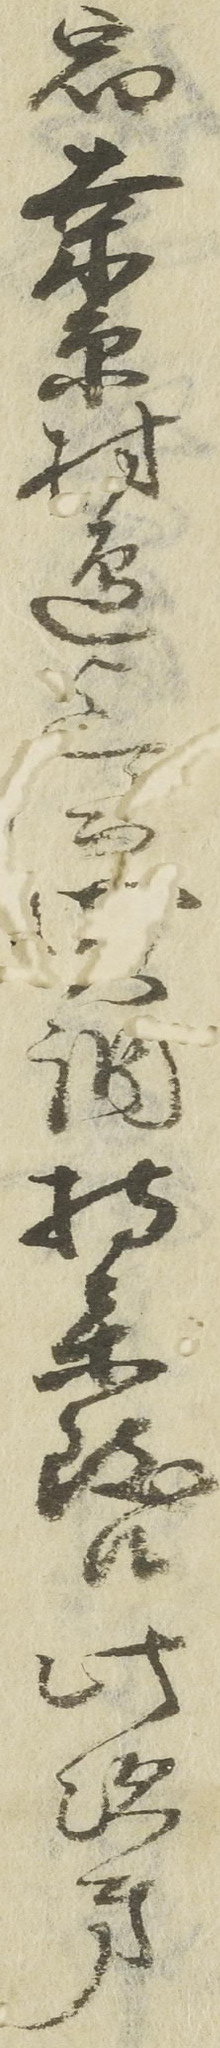宿桑原村辺迄ニ而調持参致候此次第
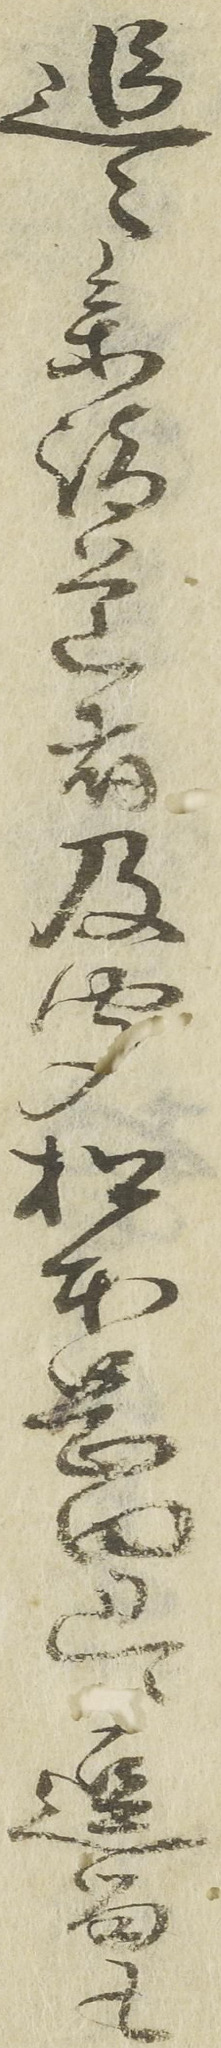追々参詣道者及聞松本岡田辺ニ逗留も
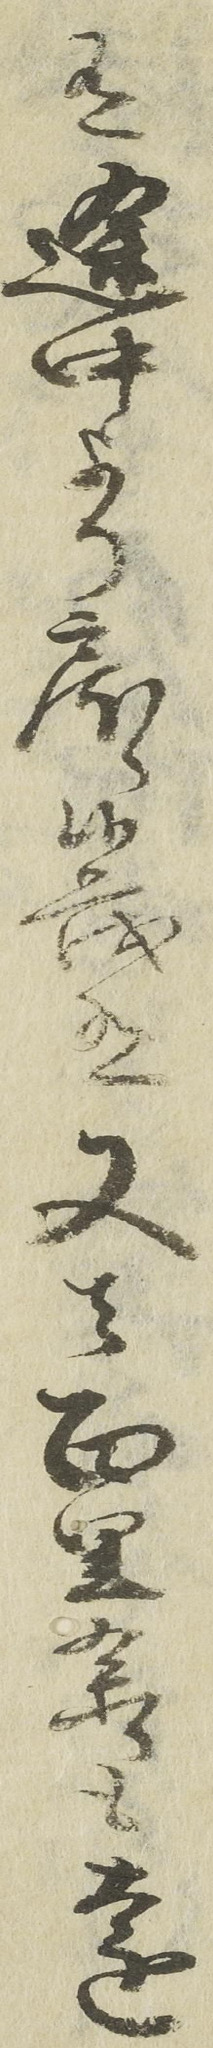有途中より戻り候も有又は百里余りも遠
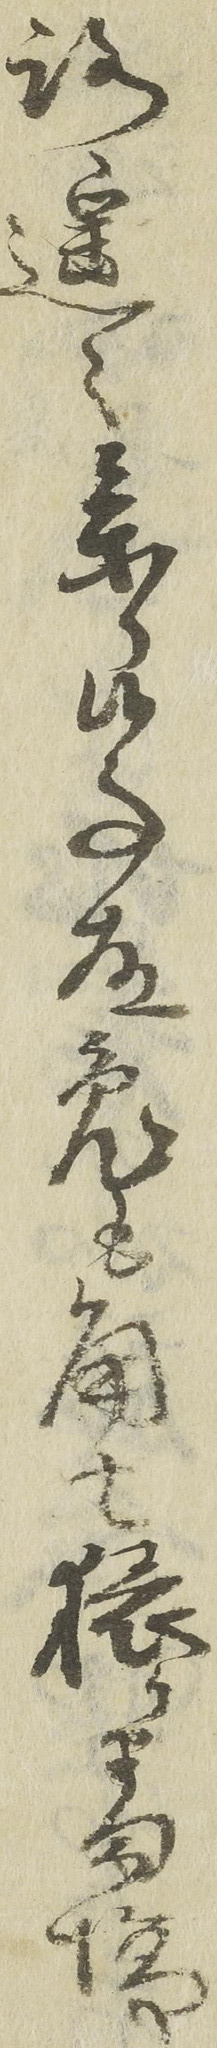路遥々参り候事故兎も角も振？り番場
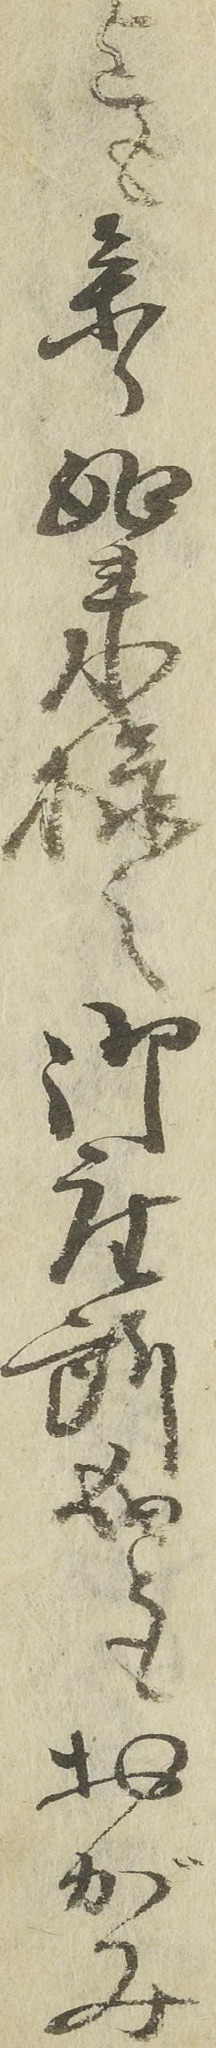迄も参り如来様之御座所成ともおがみ

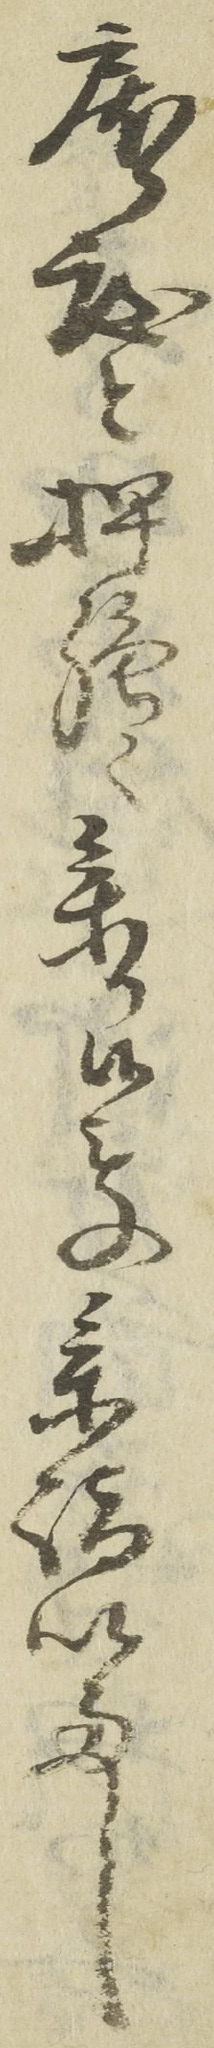戻り度と押強く参り候もの参詣いたし
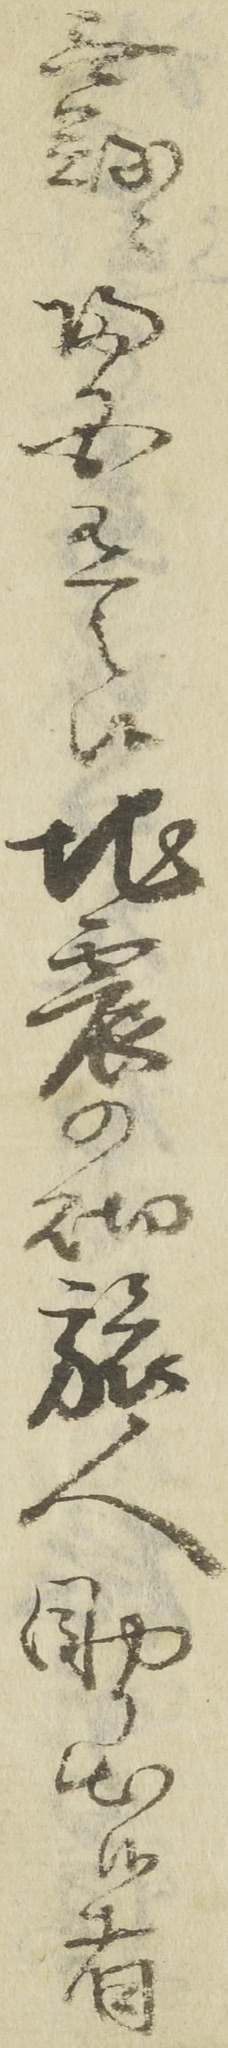無難ニ帰国有之候地震の砌旅人助り出候者
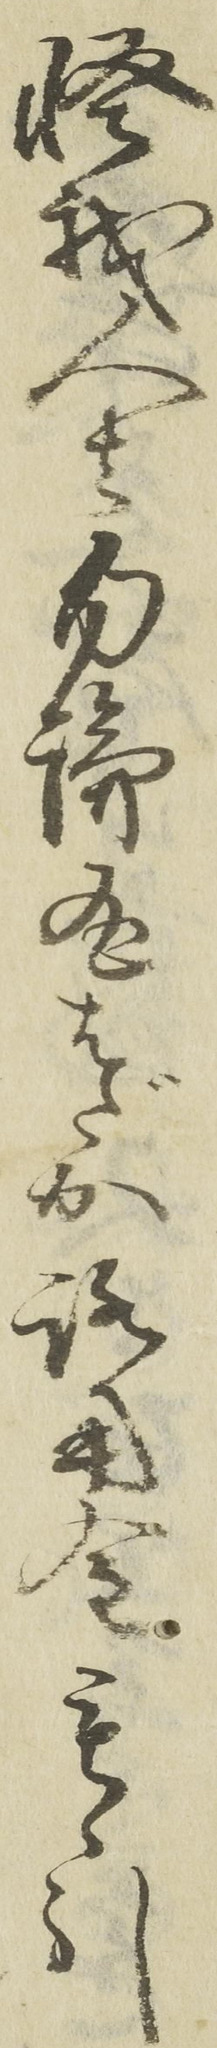怪我人は勿論丸はだか路用金もゝ引
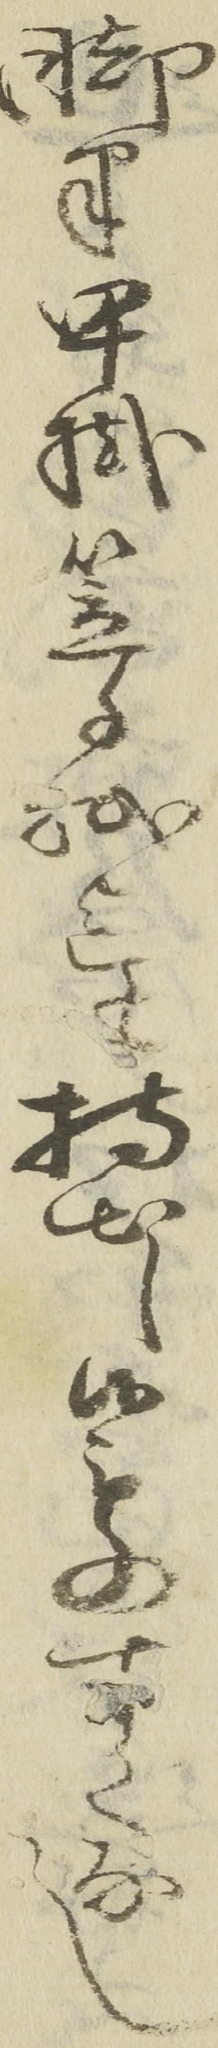脚半甲掛笠手拭迄も持出し候ものすくなし
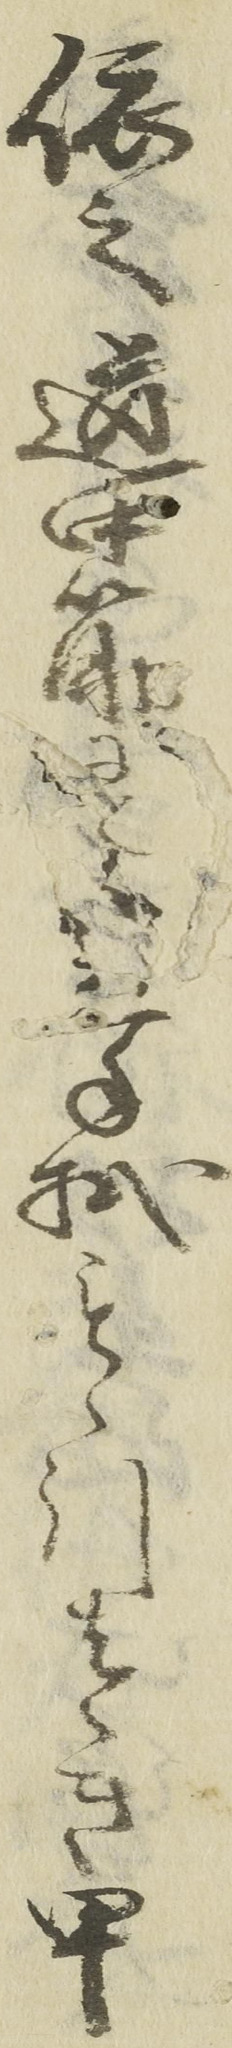依之道中筋ニ甲掛笠手拭もゝ引はゝき甲
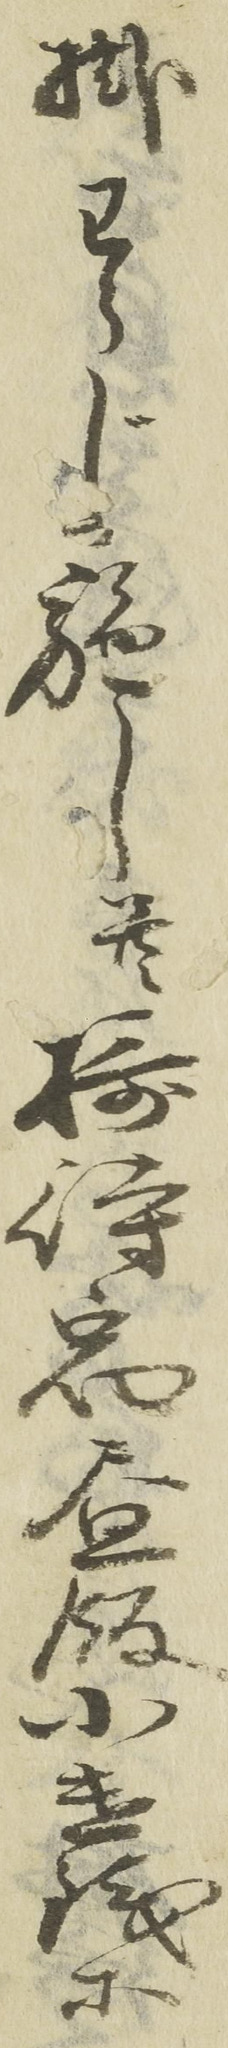掛わらじの施し幷ニ接待宿昼飯小遣銭等
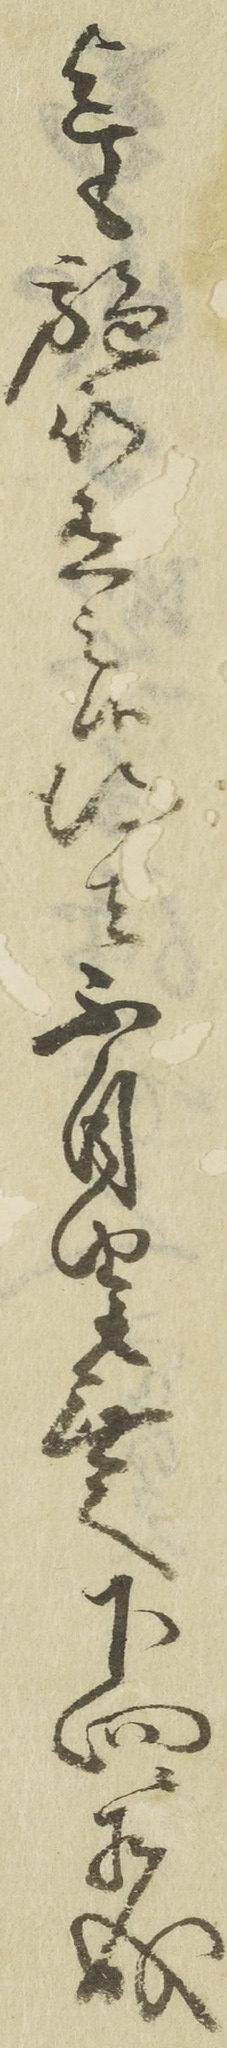迄も施行有之候得は不自由も無之下向ニ相成
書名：弘化四　大地震由来　全
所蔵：東京大学地震研究所図書室 Earthquake Research Institute Library, The University of Tokyo, JAPAN
